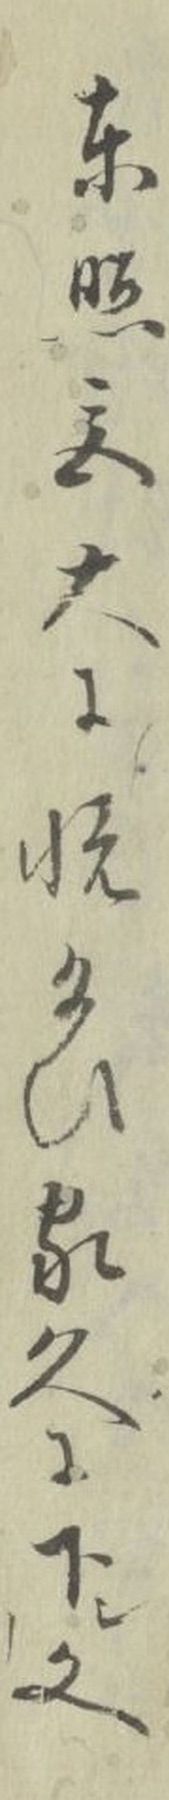東照宮大に悦給ひ家久に下し文
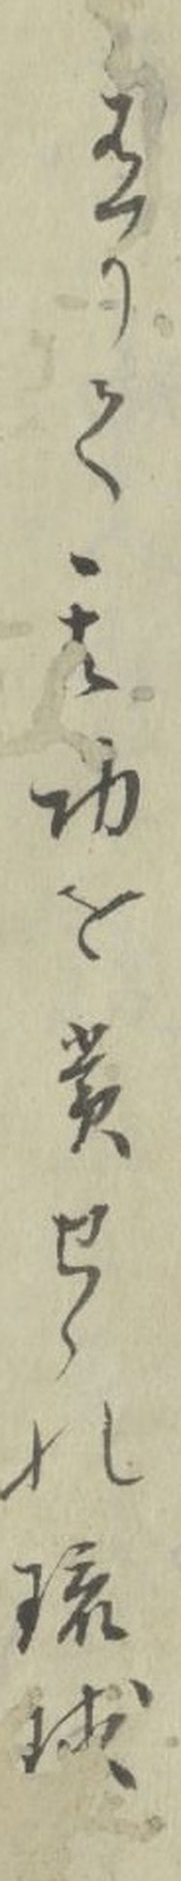有りて其功を賞せられ琉球

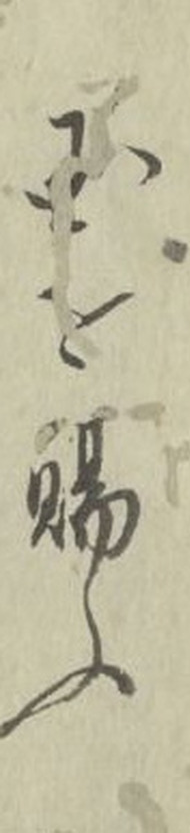国を賜ふ
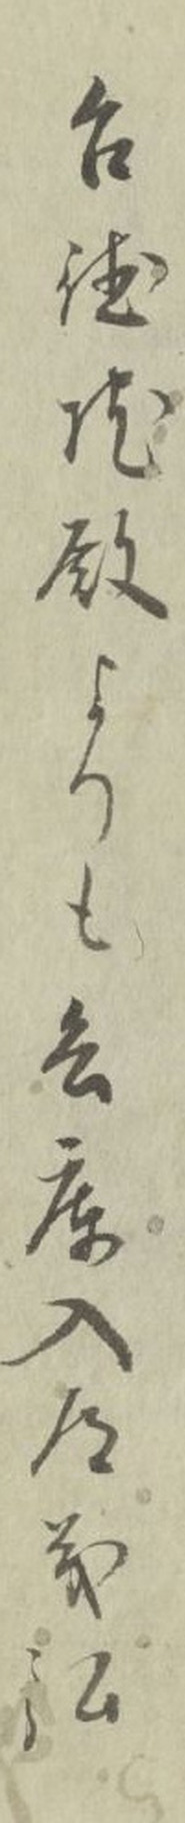台徳院殿よりも兵庫入道義弘
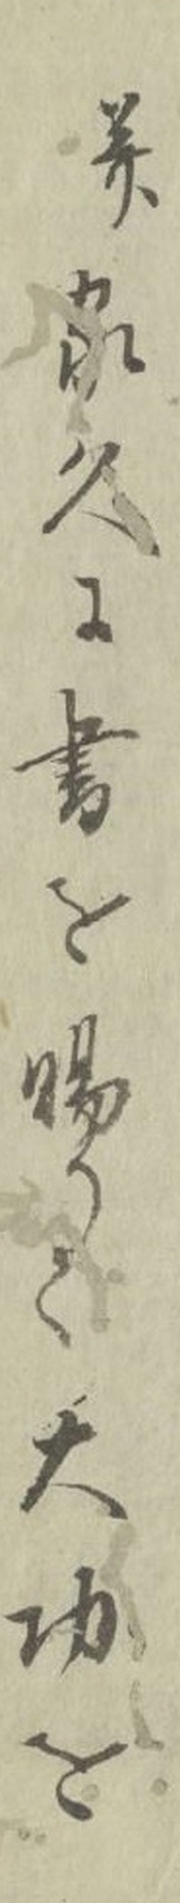幷家久に書を賜りて大功を
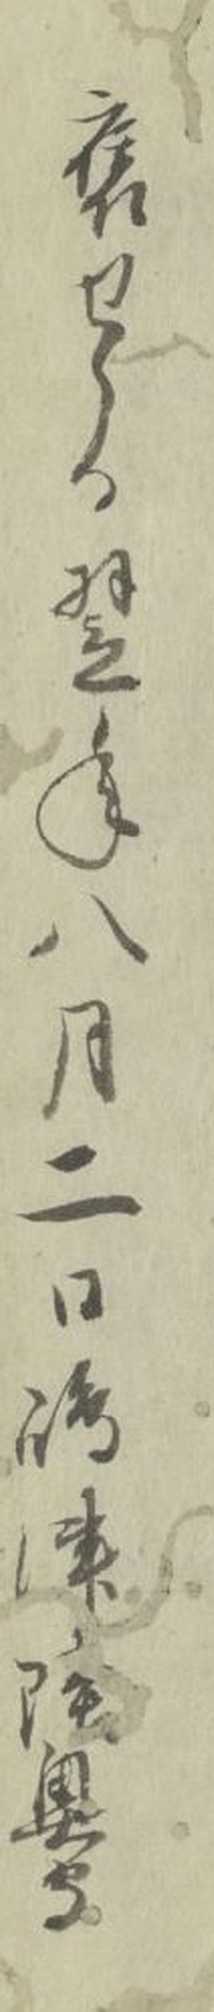褒せらる翌年八月二日島津陸奥守
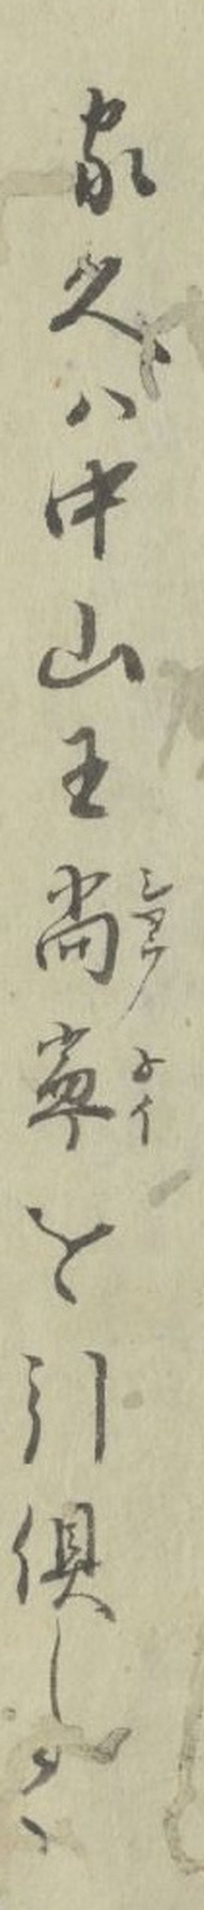家久は中山王尚寧を引倶して
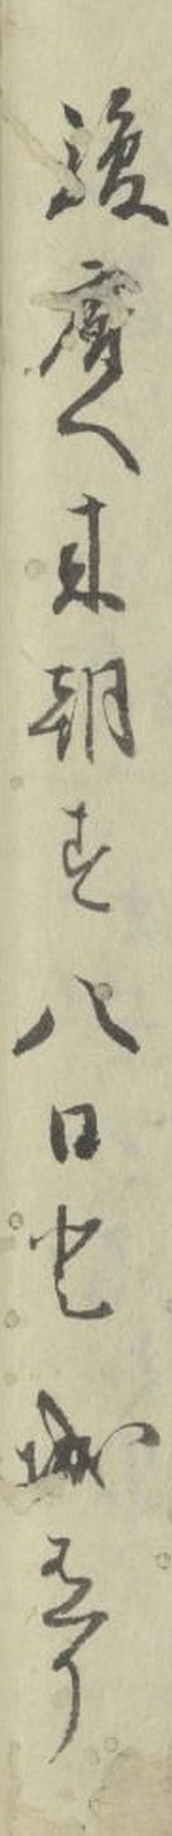駿府へ来朝す八日登城有り
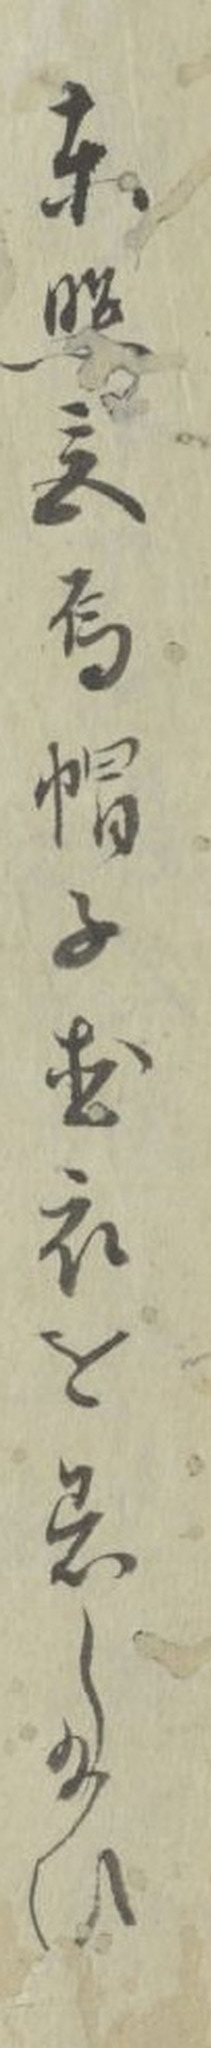東照宮烏帽子直衣を着し給ひ
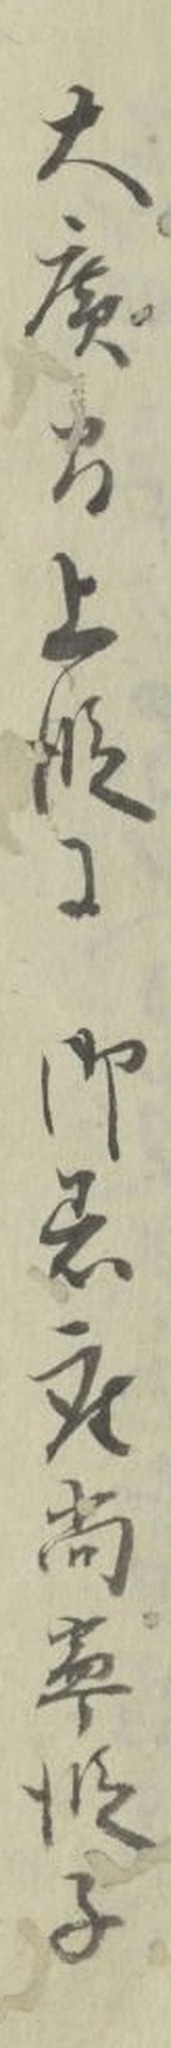大広間上段に御着座尚寧段子
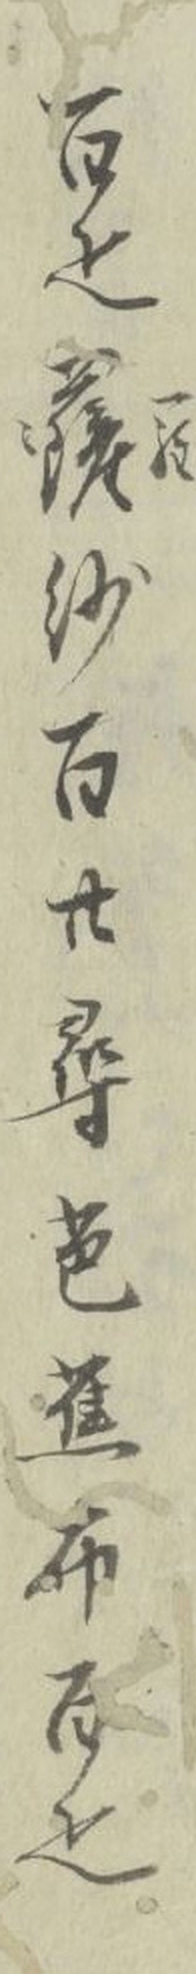百疋羅紗百廿尋芭蕉布百疋
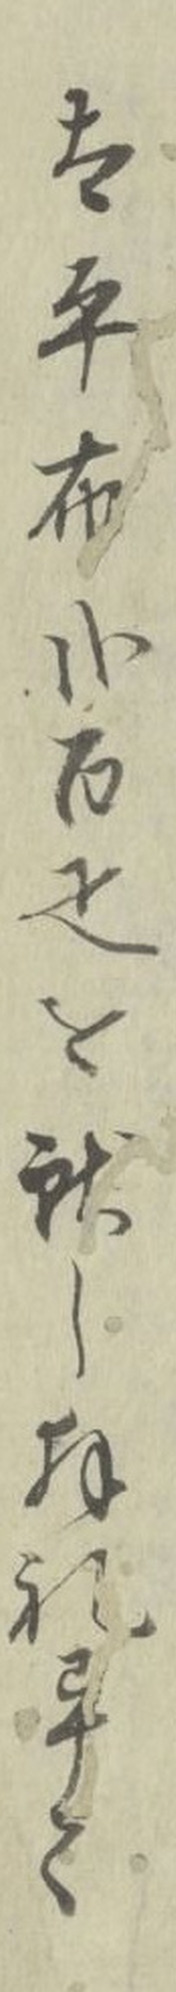太平布弐百疋を献し拝礼畢て
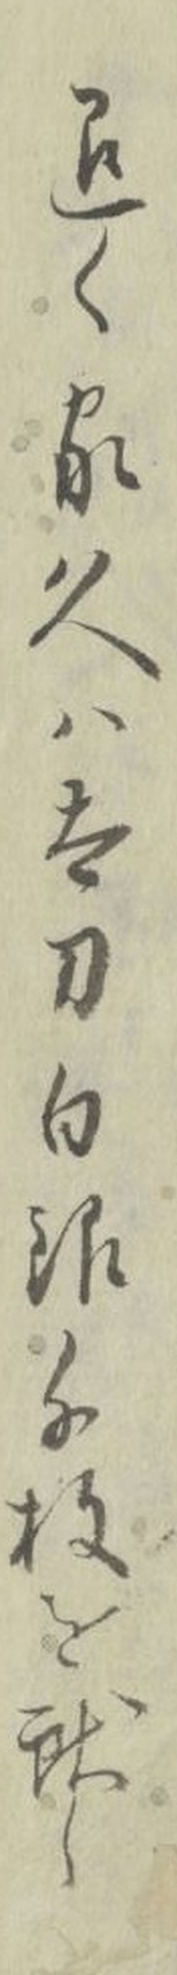退く家久は太刀白銀千枚を献し
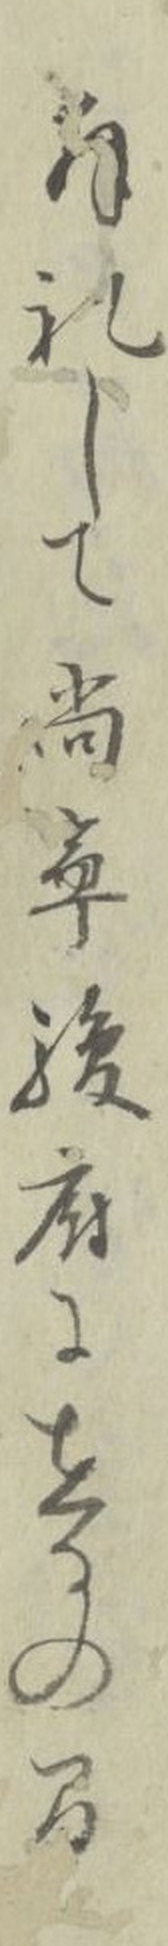拝礼して尚寧駿府に在るの間

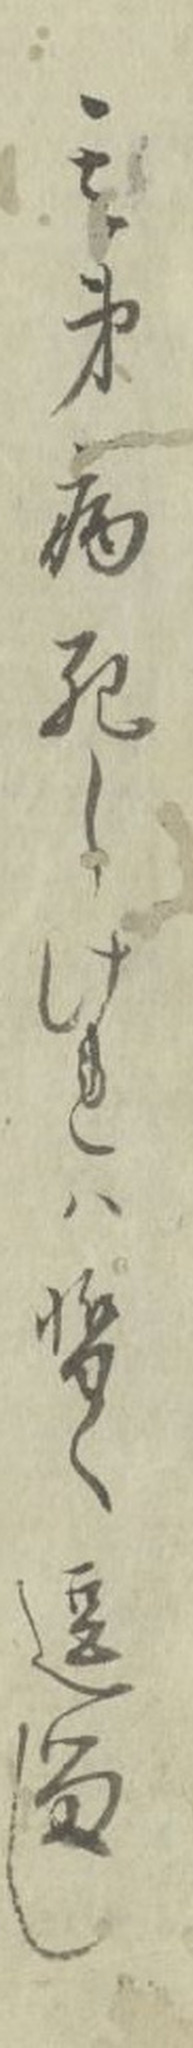其弟病死しけれは暫く逗留し
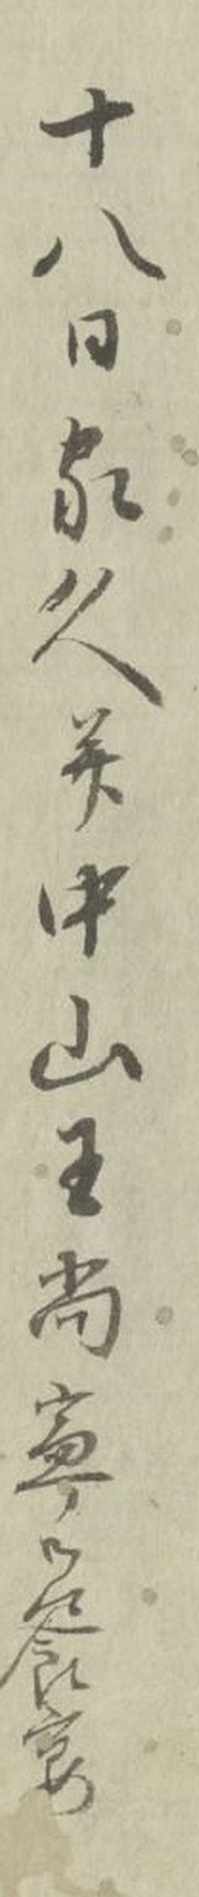十八日家久幷中山王尚寧御饗宴
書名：琉球来朝記 自一至七
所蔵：University of the Ryukyus Library
